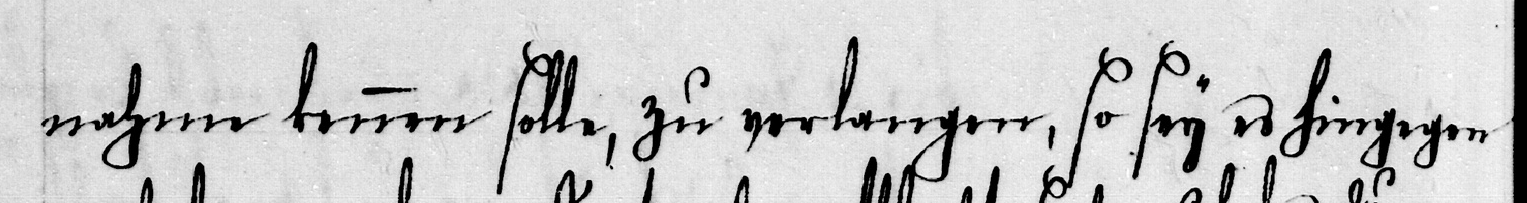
nahme kennen solle, zu verlangen, so sey es hingegen
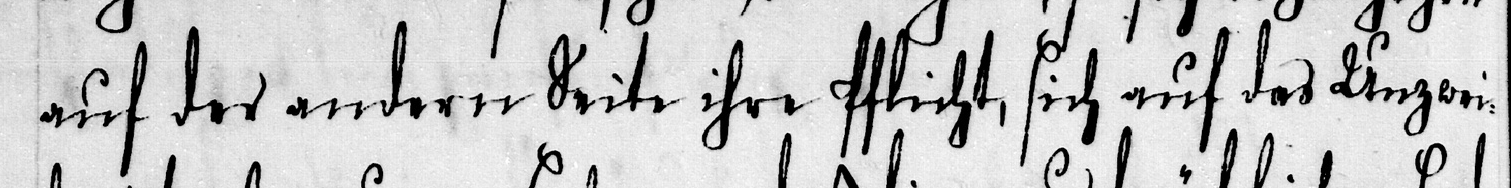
auf der andern Seite ihre Pflicht, sich auf das Unzwei¬
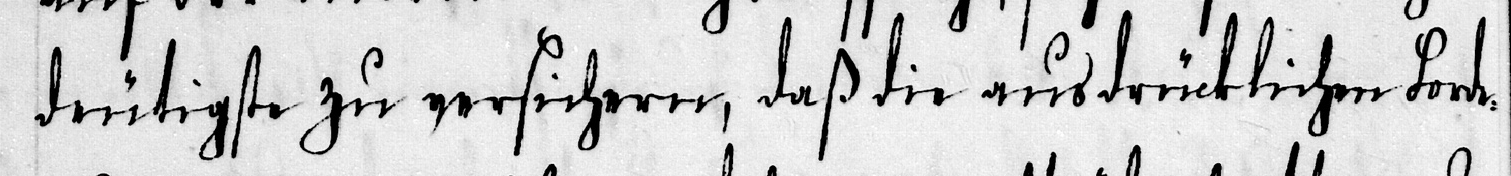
deutigste zu versichern, daß die ausdrücklichen Ford¬
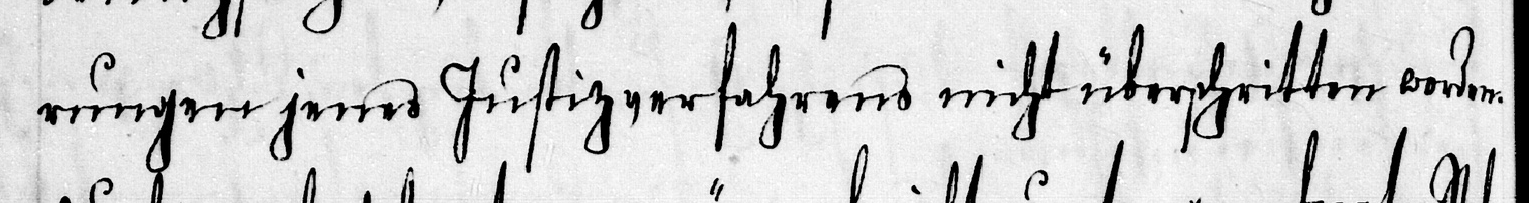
erungen jenes Justizverfahrens nicht überschritten worden.
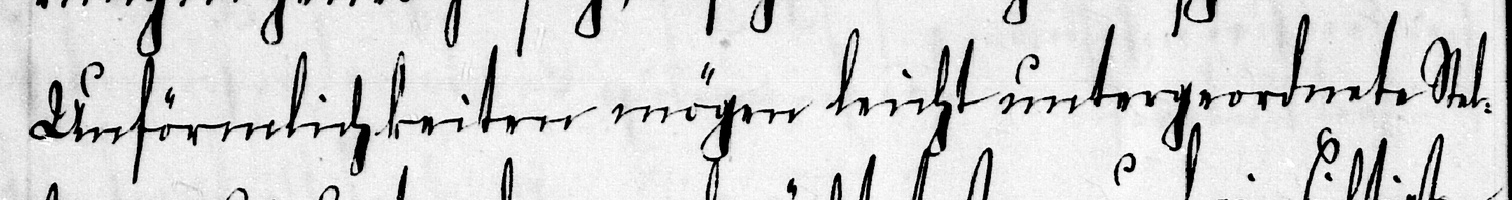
Unförmlichkeiten mögen leicht untergeordnete Ste¬
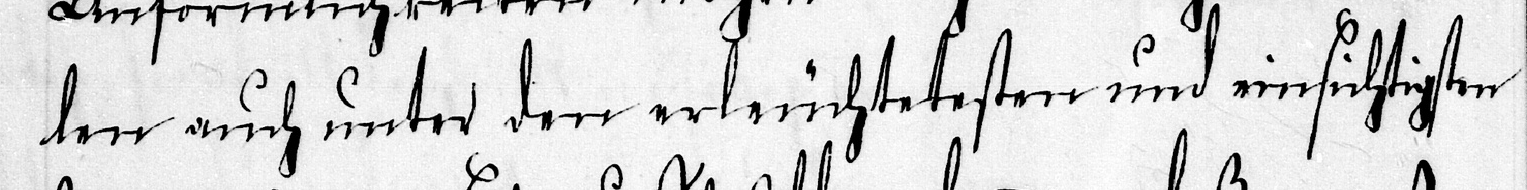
llen auch unter den erleuchtetesten und einsichtigsten
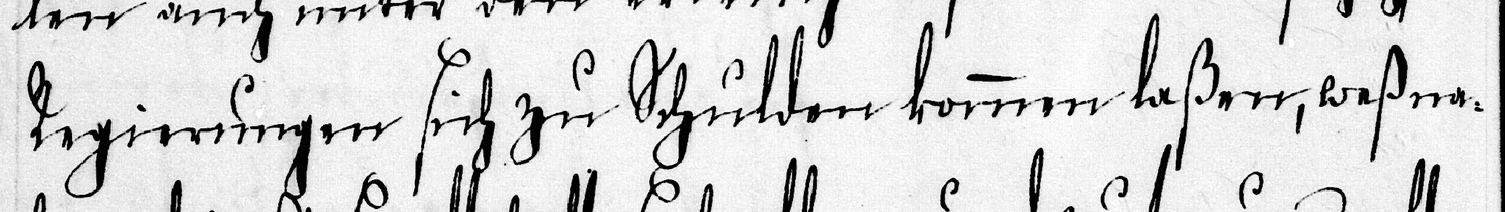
Regierungen sich zu Schulden kommen laßen, weßna¬
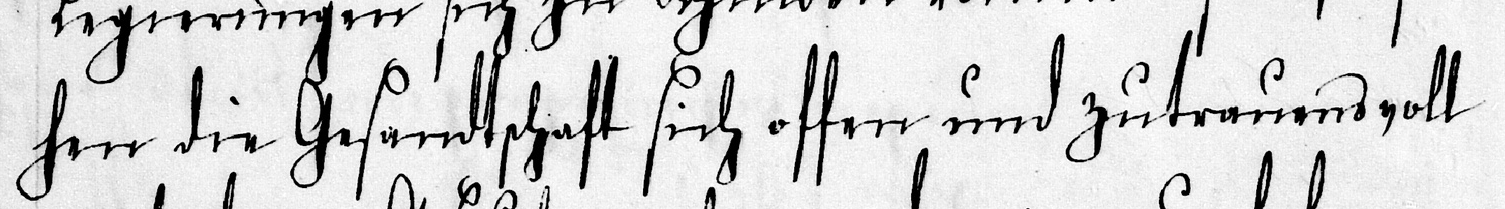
hen die Gesandtschaft sich offen und zutrauensvoll
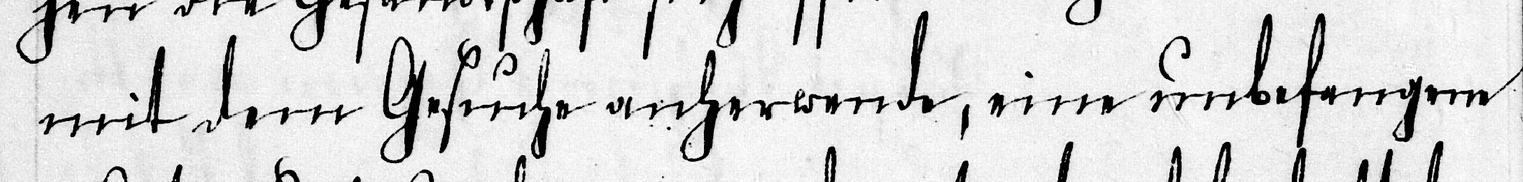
mit dem Gesuche anherwende, eine unbefangene
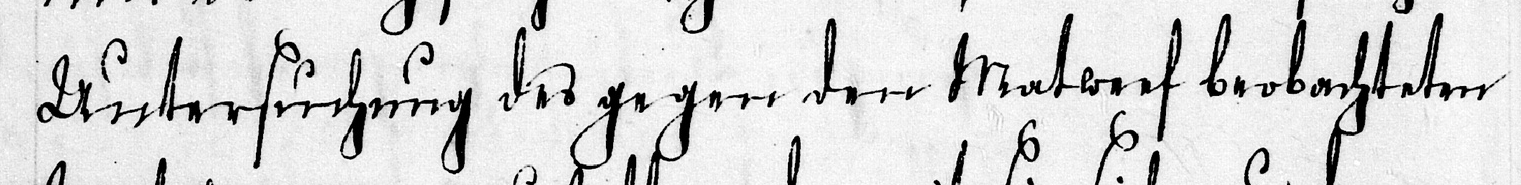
Untersuchung des gegen den Matweef beobachteten
